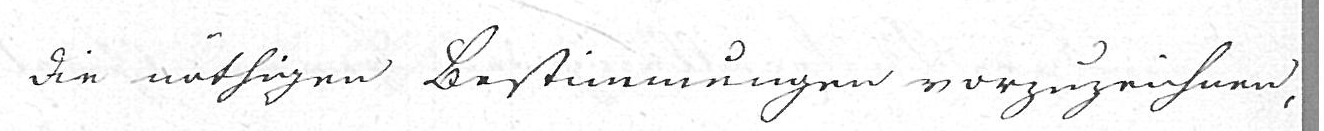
die nöthigen Bestimmungen vorzuzeichnen,
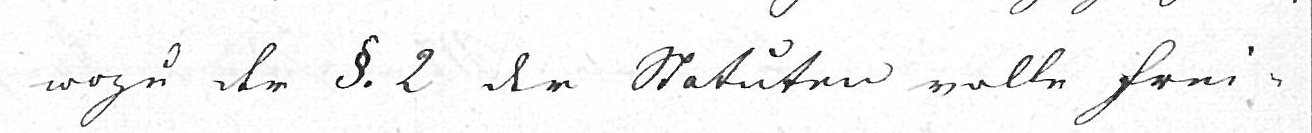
wozu der §. 2. der Statuten volle Frei-
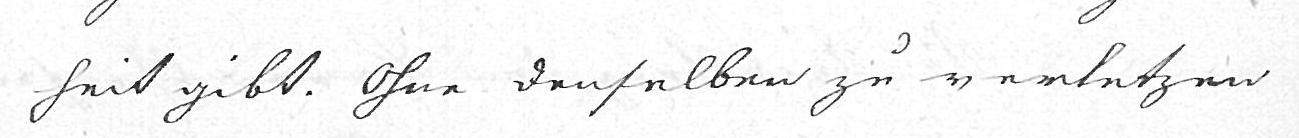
heit gibt. Ohne denselben zu verletzen
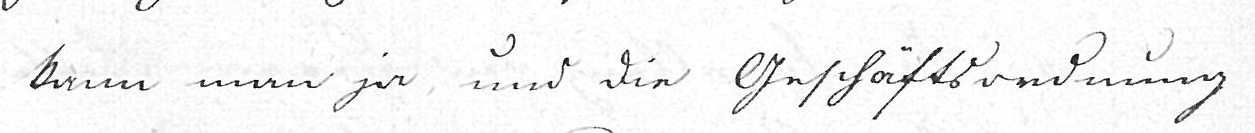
kann man ja und die Geschäftsordnung
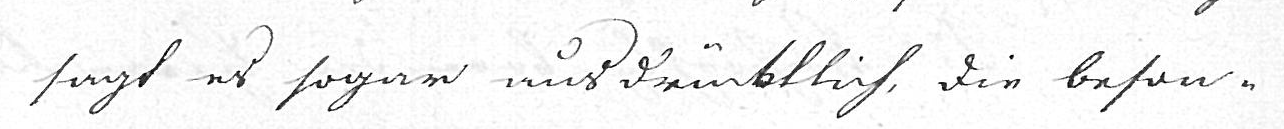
sagt es sogar ausdrücklich, die beson-
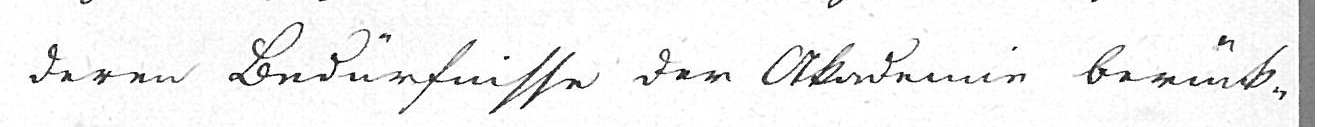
deren Bedürfnisse der Akademie berück-
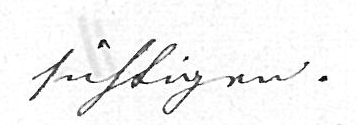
sichtigen.
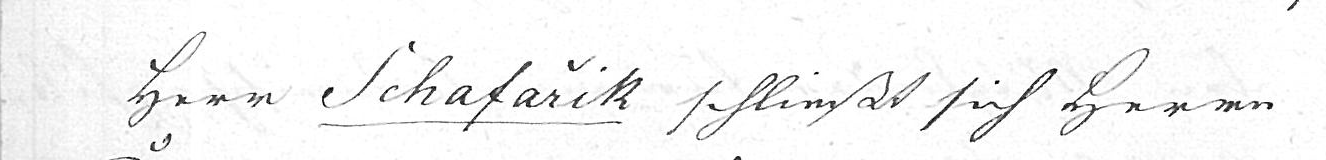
Herrn Schafarik schließt sich Herrn
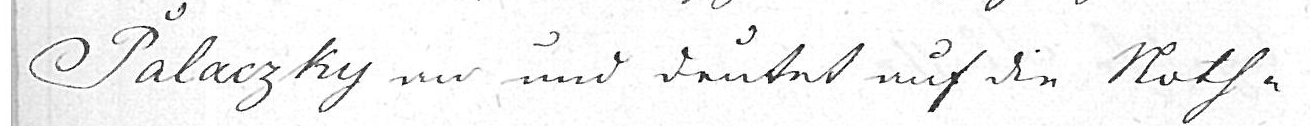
Palaczky an und deutet auf die Noth-
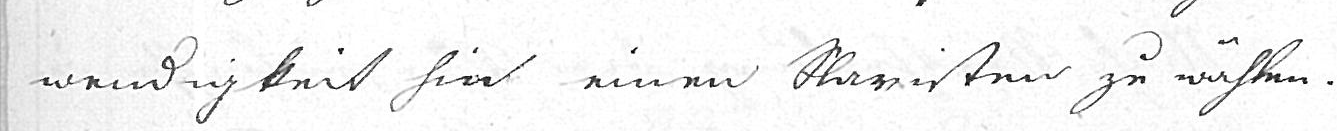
wendigkeit hin einen Slavisten zu wählen.
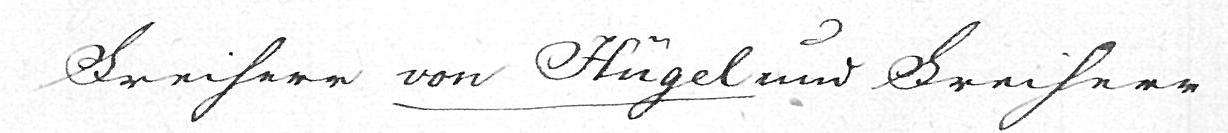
Freiherr von Hügel und Freiherr
